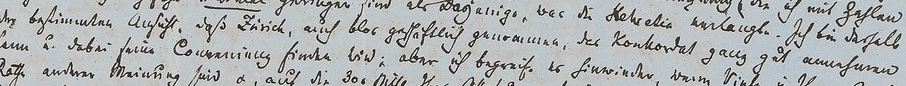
der bestimmten Ansicht, daß Zürich, auch blos geschäftlich genommen, das Konkordat ganz gut annehmen
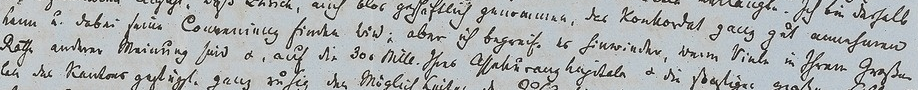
kann u. dabei seine Convenienz finden wird, aber ich begreife es hinwieder, wenn Viele in Ihrem Großen
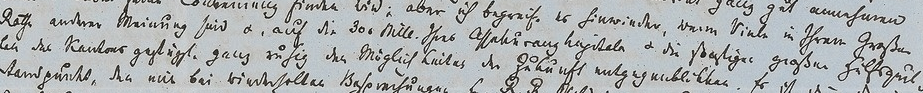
Rathe andrer Meinung sind &, auf die 300 Mill. Ihres Assekuranzkapitals & die sonstigen großen Hilfsquel-
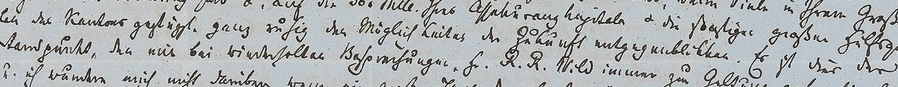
len des Kantons gestützt, ganz ruhig den Möglichkeiten der Zukunft entgegenblikken. Es ist dies der
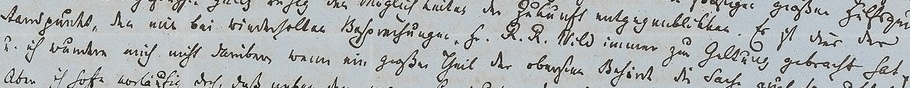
Standpunkt, den mir bei wiederholten Besprechungen, Hr. R.R. Wild immer zur Geltung gebracht hat,
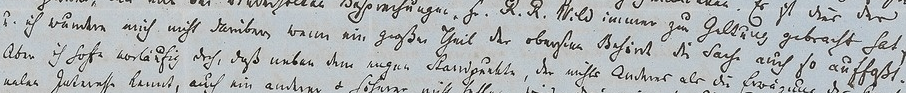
u. ich wundre mich nicht darüber, wenn ein großer Theil der obersten Behörde die Sache auch so auffaßt.
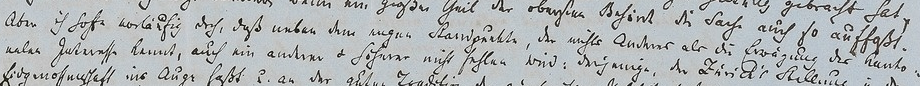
Aber ich hoffe vorläufig doch, daß neben dem regen Standpunkte, der nichts Anderes als die Erwägung der Kanto-
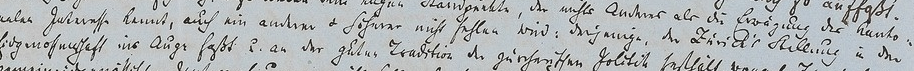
nalen Interesse kennt, auch ein anderer & höherer nicht fehlen wird: derjenige, der Zürich's Stellung in der
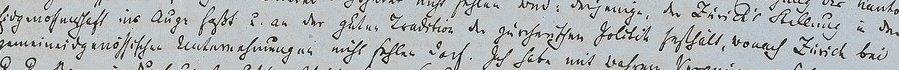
Eidgenossenschaft ins Auge faßt u. an der guten Tradition der zürcherischen Politik festhält, wonach Zürich bei
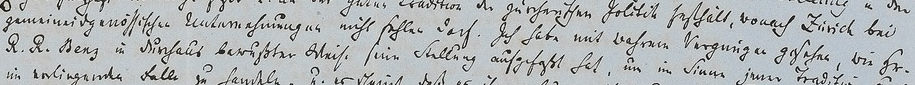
gemeineidgenössischen Unternehmungen nicht fehlen darf. Ich habe mit wahrem Vergnügen gesehen, wie Hr.
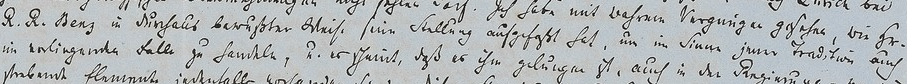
R.R. Benz in durchaus bewußter Weise seine Stellung aufgefaßt hat, um im Sinne jener Tradition auch
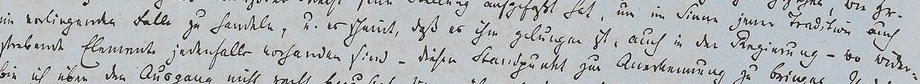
im vorliegenden Falle zu handeln, u. es scheint, daß es ihm gelungen ist, auch in der Regierung – wo wider-
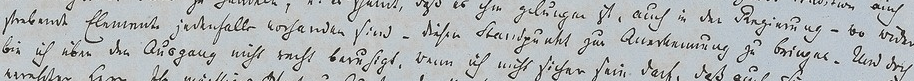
strebende Elemente jedenfalls vorhanden sind ­ diesen Standpunkt zur Anerkennung zur bringen. Und doch
